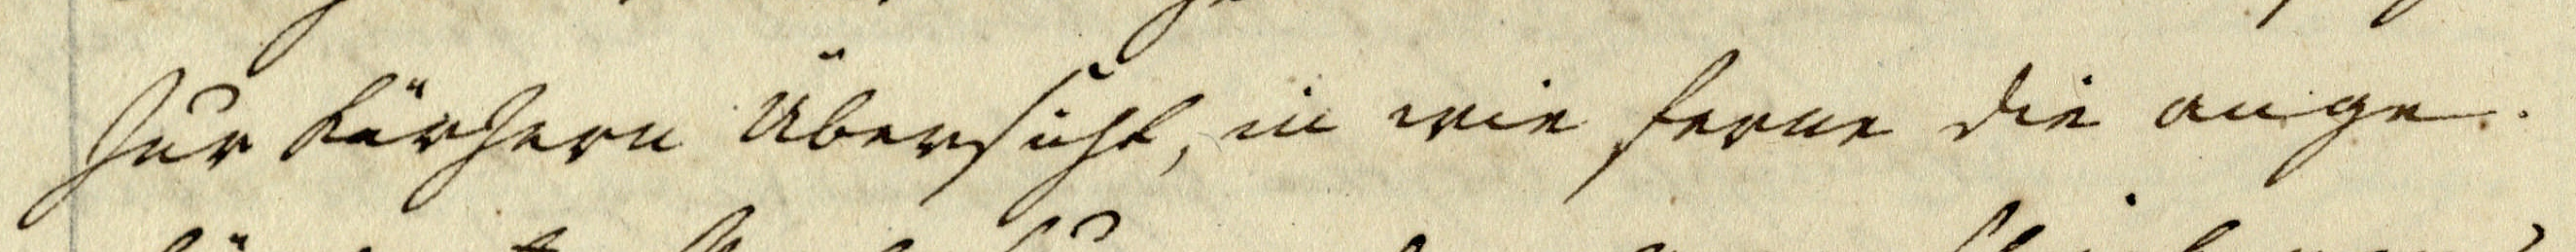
zur kürzern Übersicht, in wie ferne die ange¬
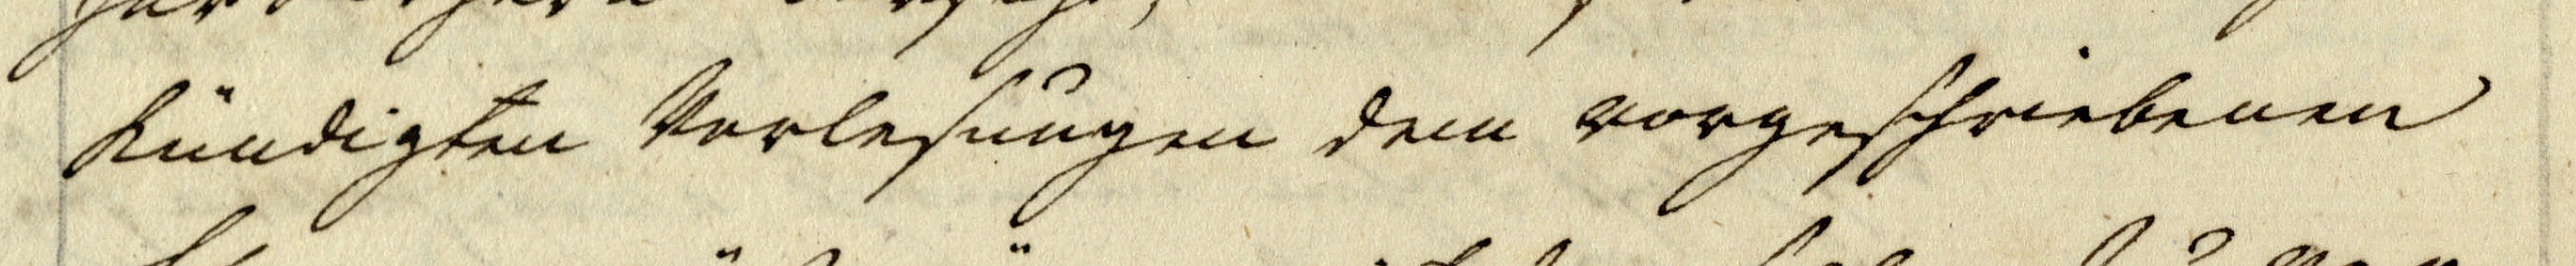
kündigten Vorlesungen dem vorgeschriebenen
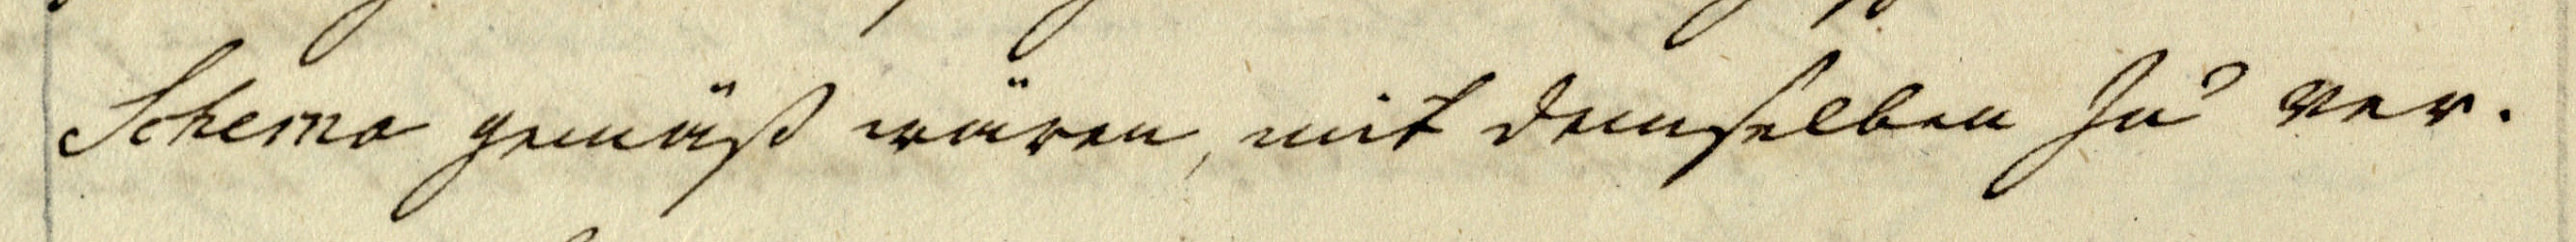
Schema gemäß wären, mit demselben zu ver¬
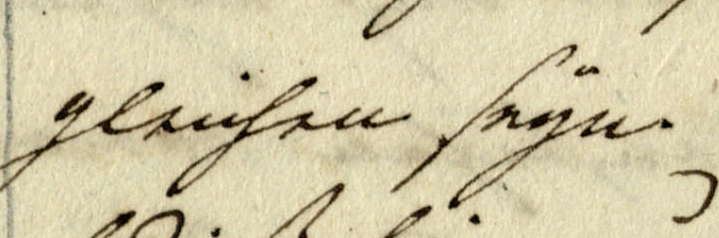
gleichen seÿn.
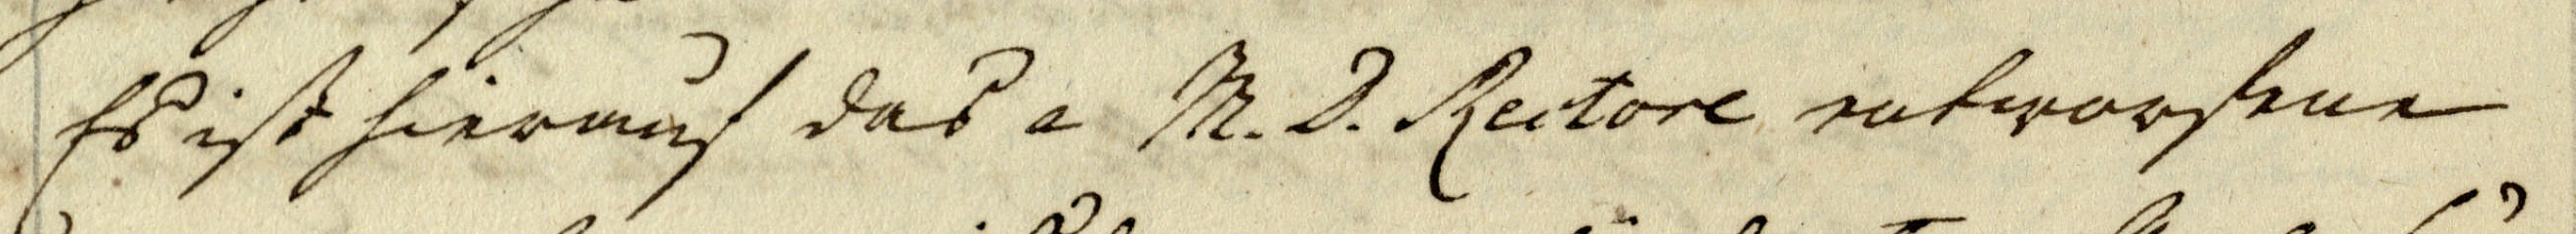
Es ist hierauf das a M. D. Rectore entworfene
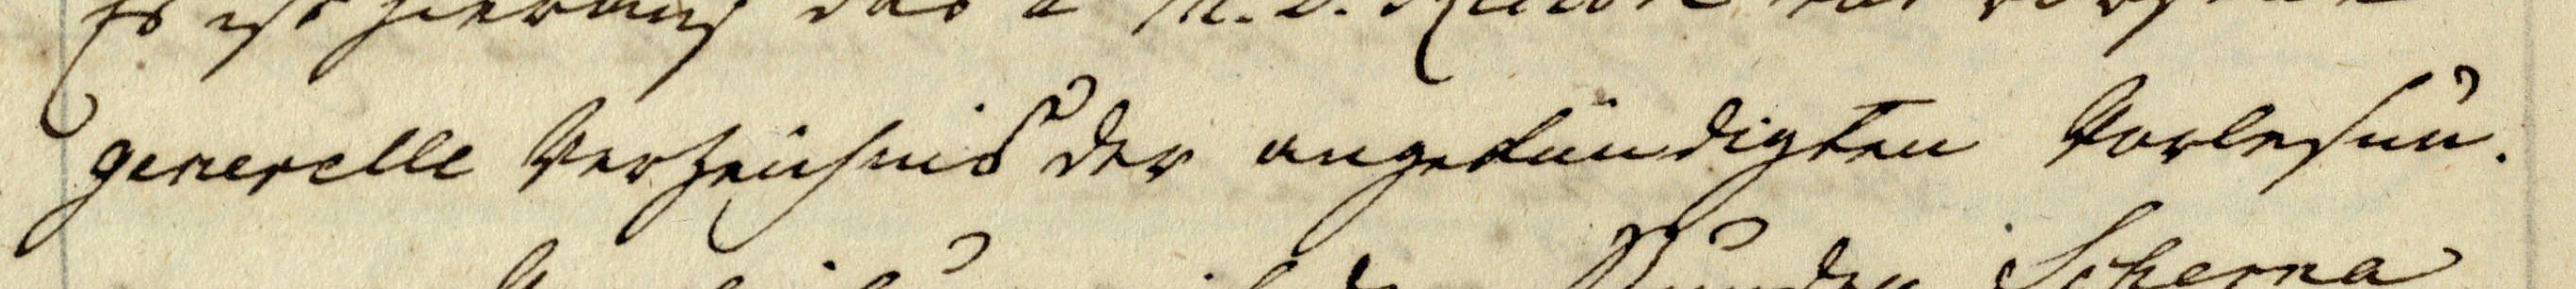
generelle Verzeichnis der angekündigten Vorlesun¬
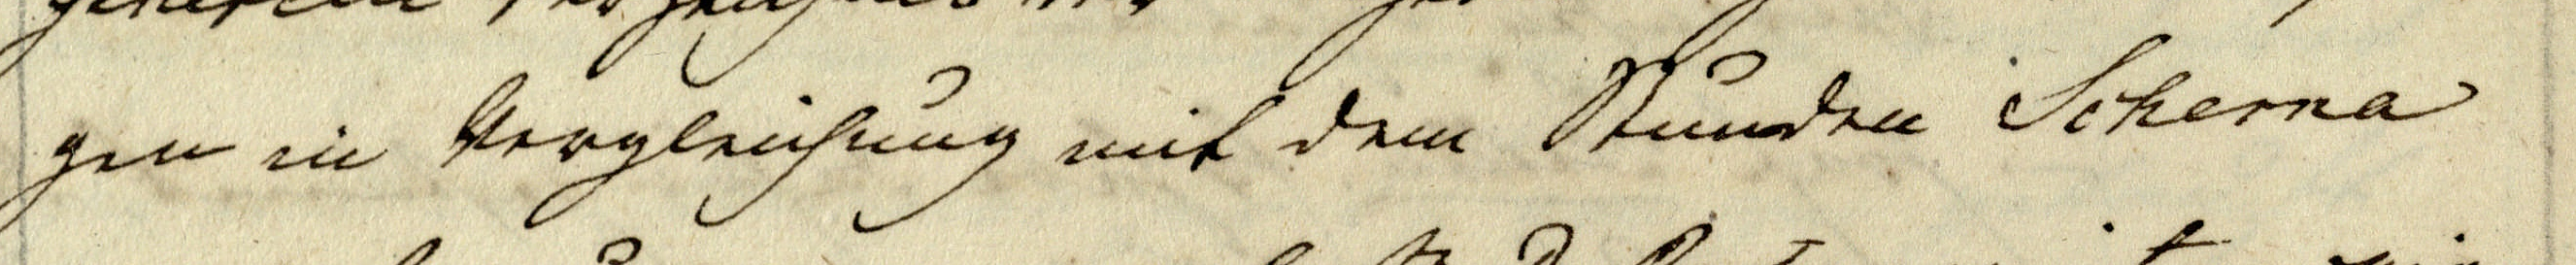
gen in Vergleichung mit dem Stunden Schema
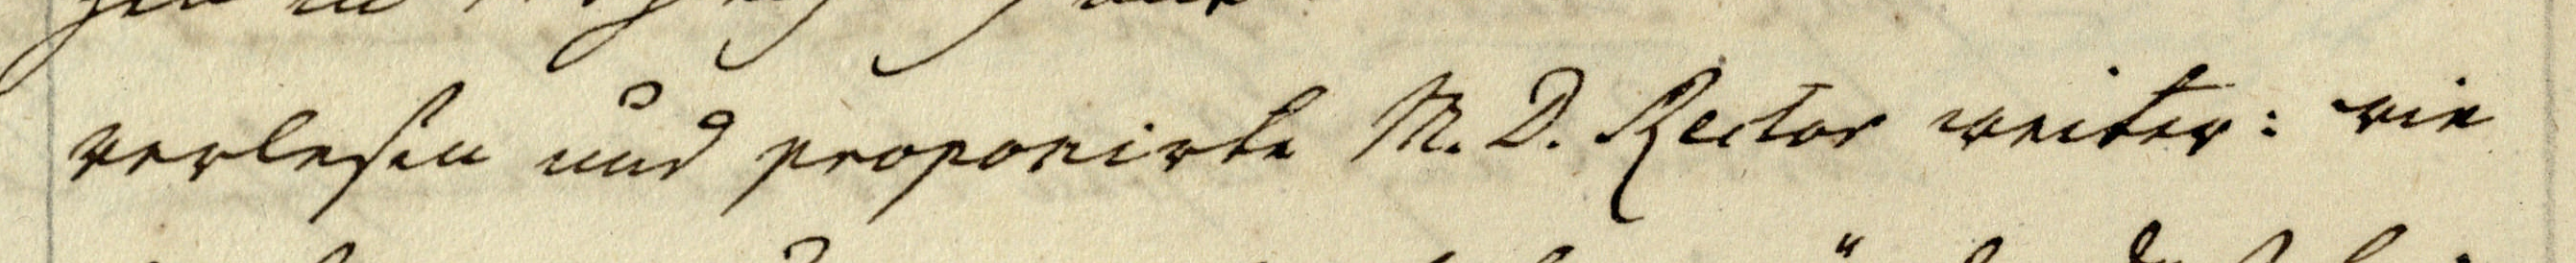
verlesen und proponirte M. D. Rector weiter: wie
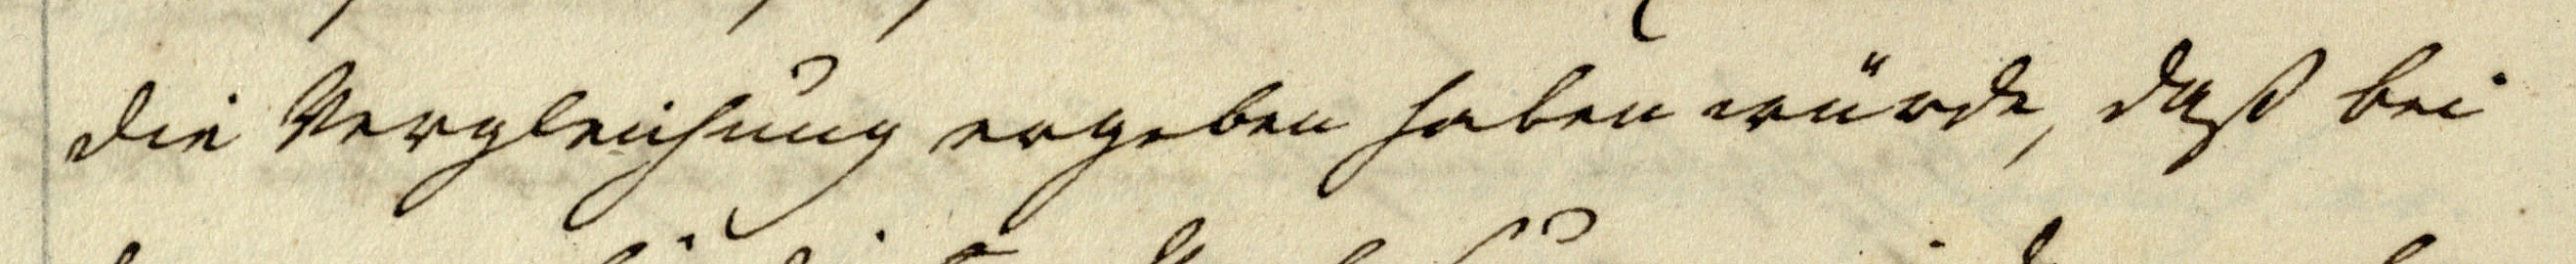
die Vergleichung ergeben haben würde, daß bei
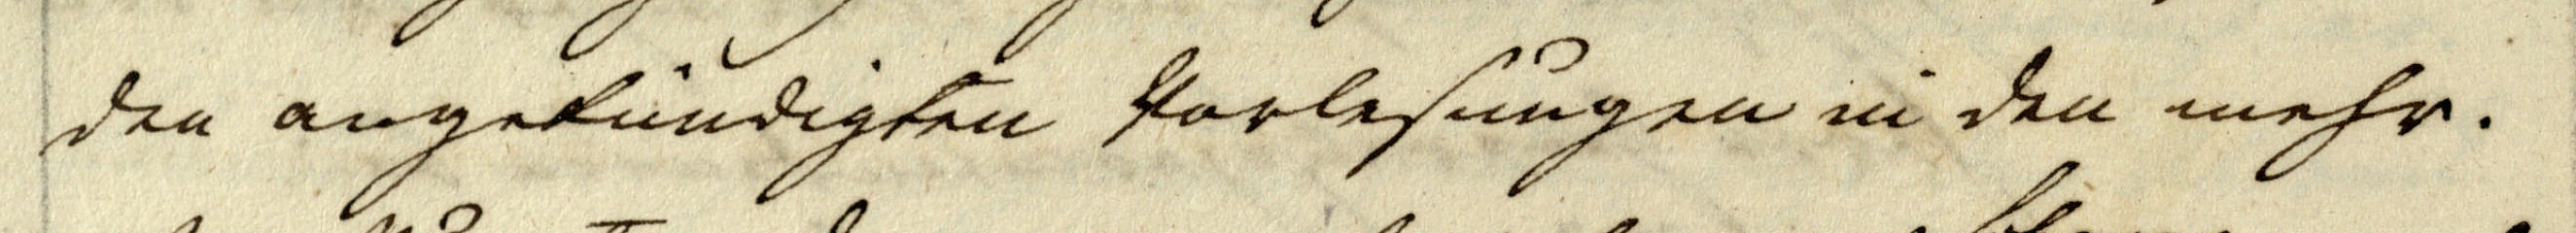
den angekündigten Vorlesungen in den mehr¬
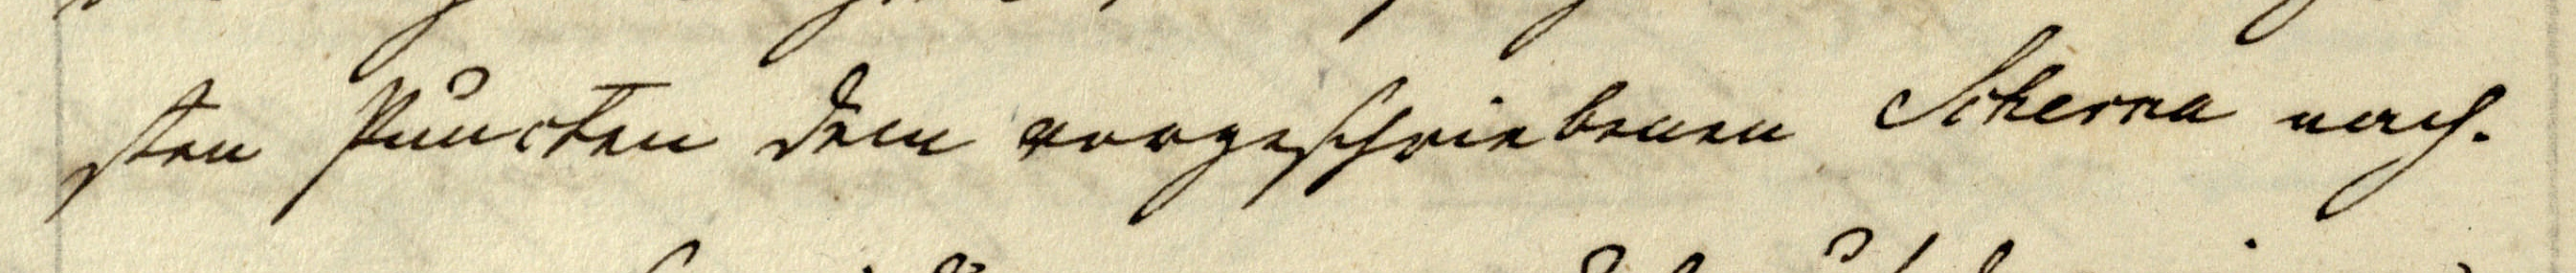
sten Puncten dem vorgeschriebenen Schema nach¬
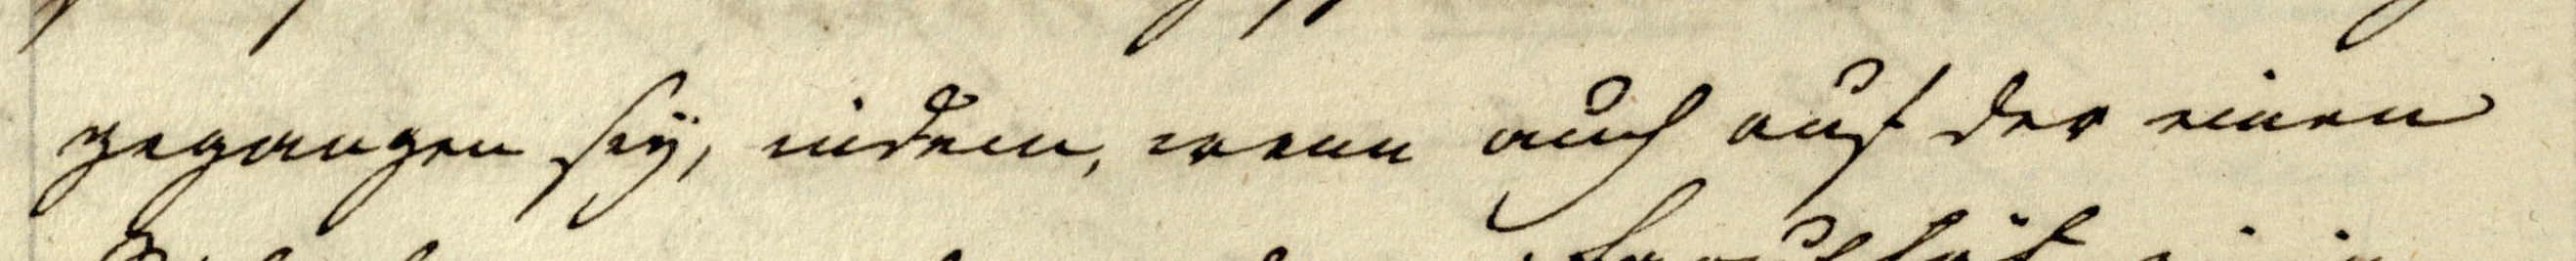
gegangen seÿ, indem, wenn auch auf der einen
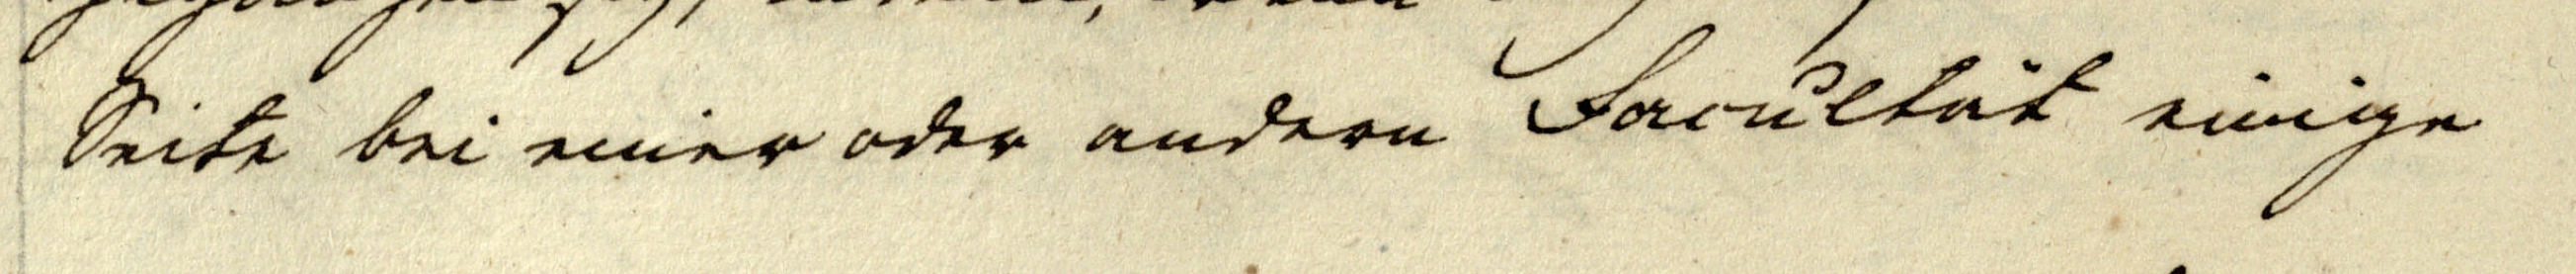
Seite bei einer oder andern Facultät einige
